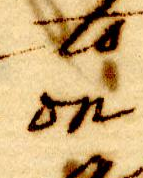on
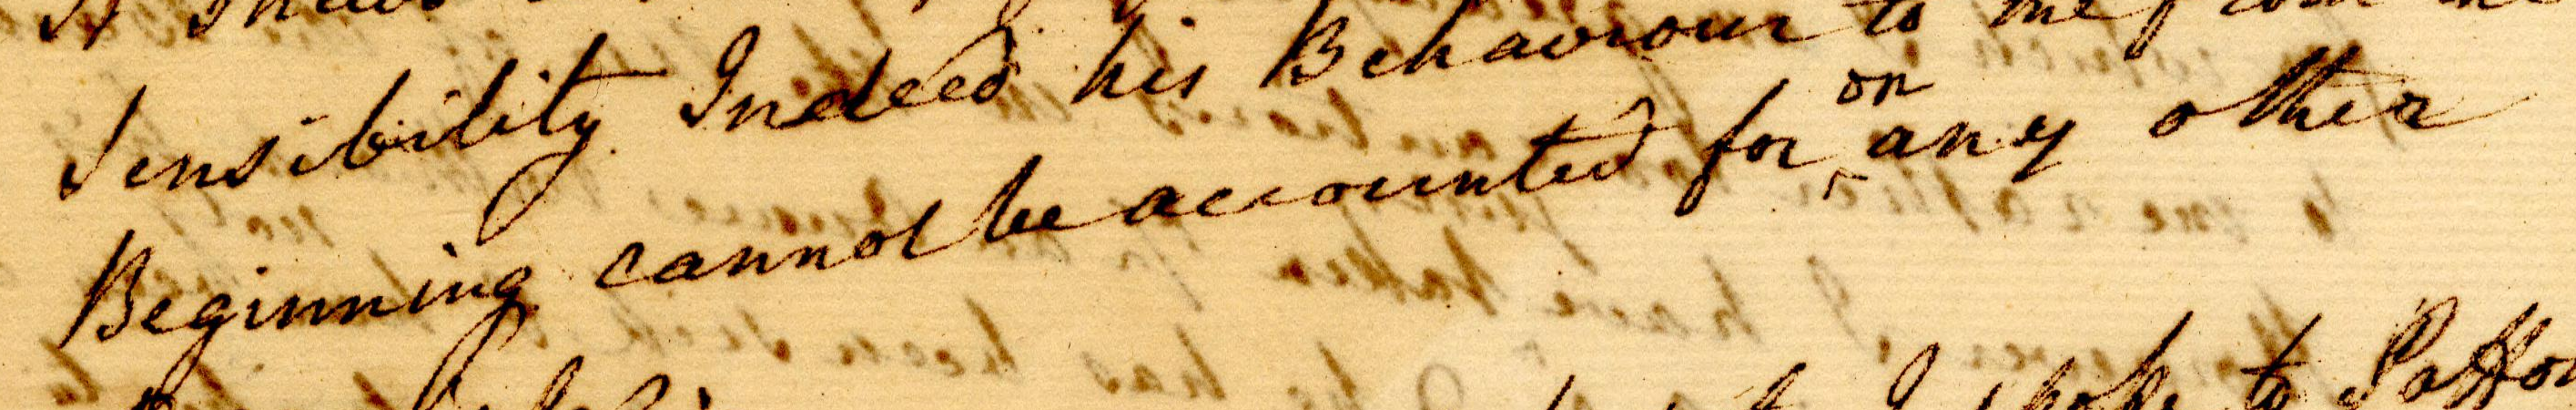Beginning cannot be accounted for ^ any other
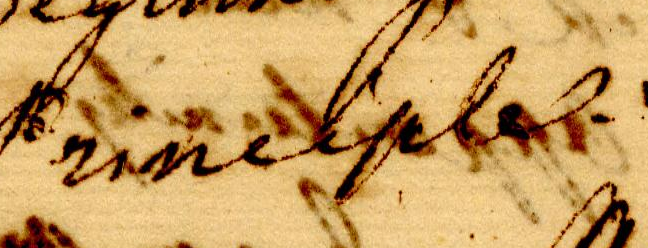Principle.
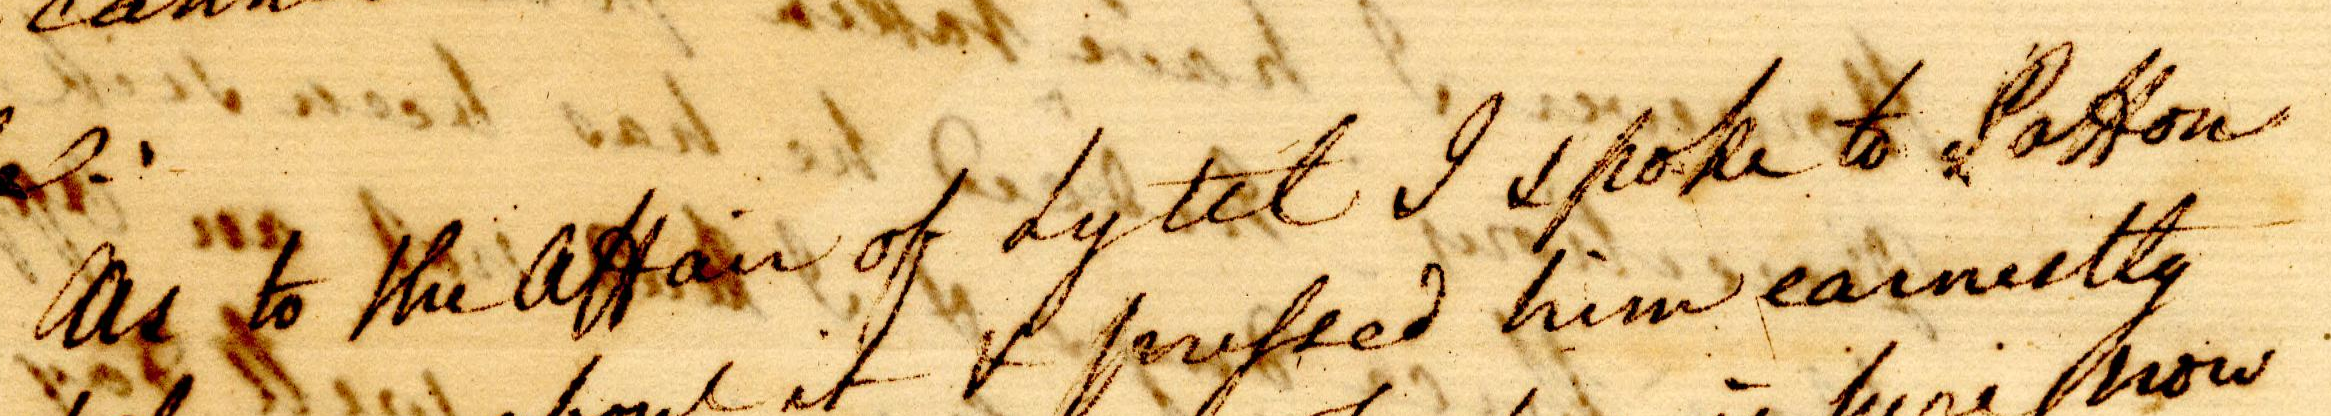As to the Affair of Lytel I spoke to Patton
